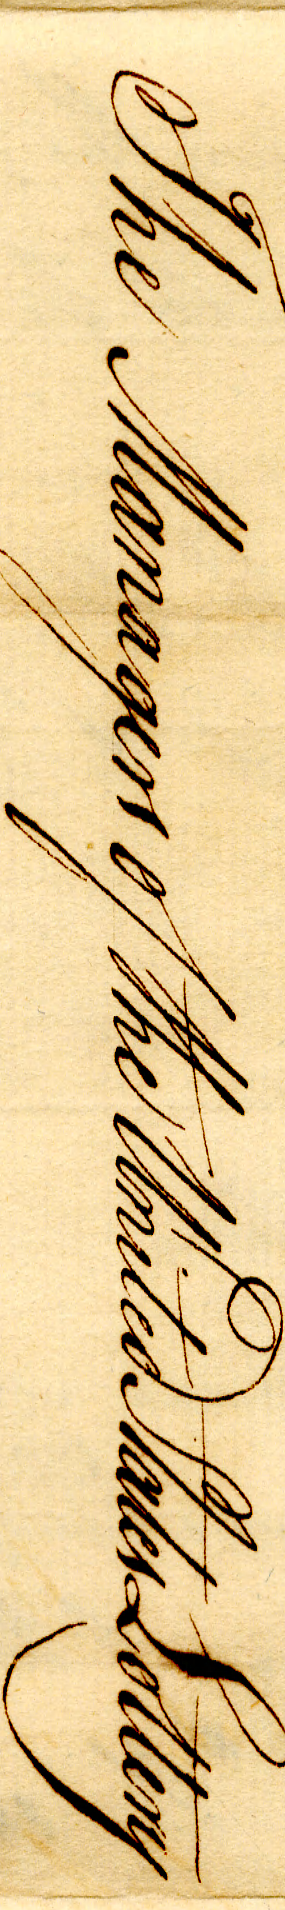The Managers of the United States Lottery
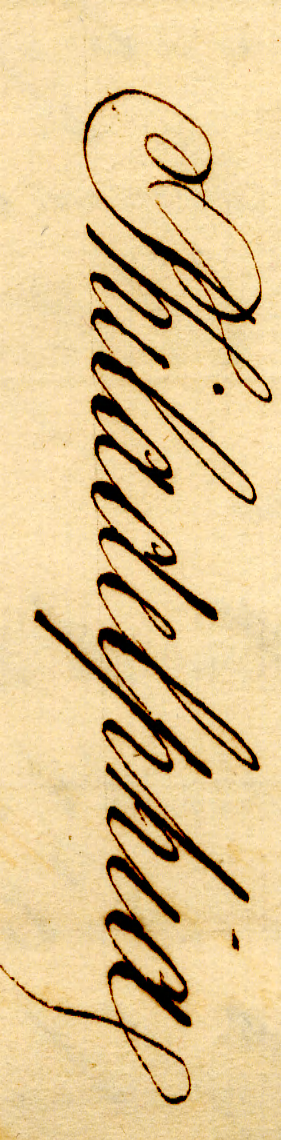Philadelphia
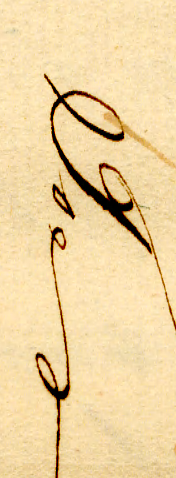To-
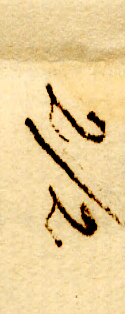2/2
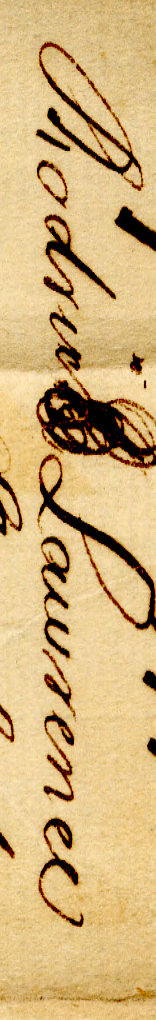Rodric Lawrence
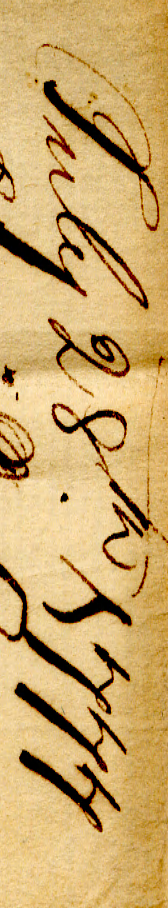July 28^th. 1777
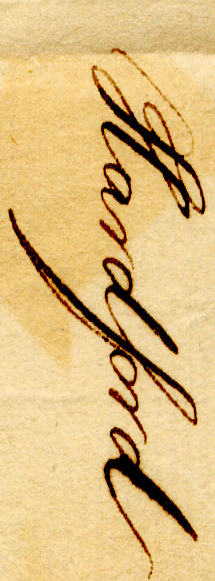Hardford
